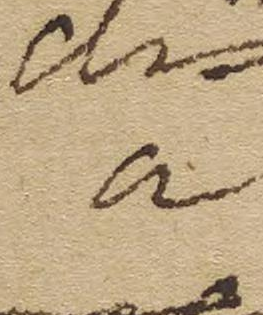a
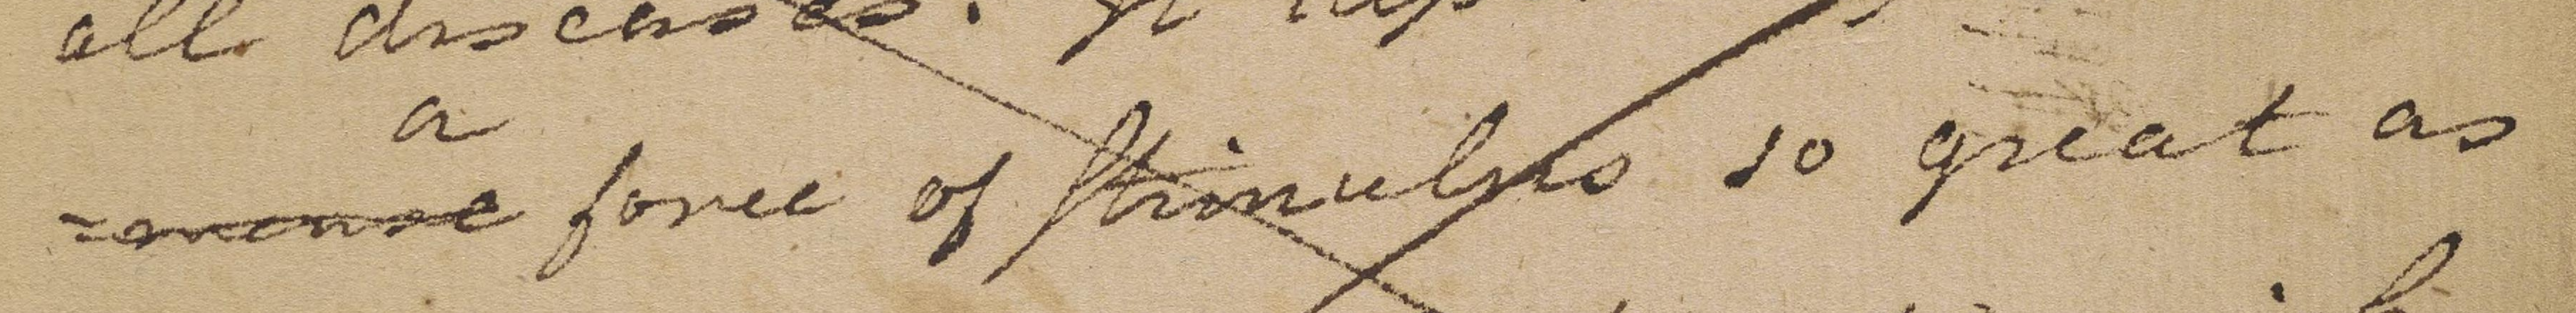[-mense] force of Stimulus so great as
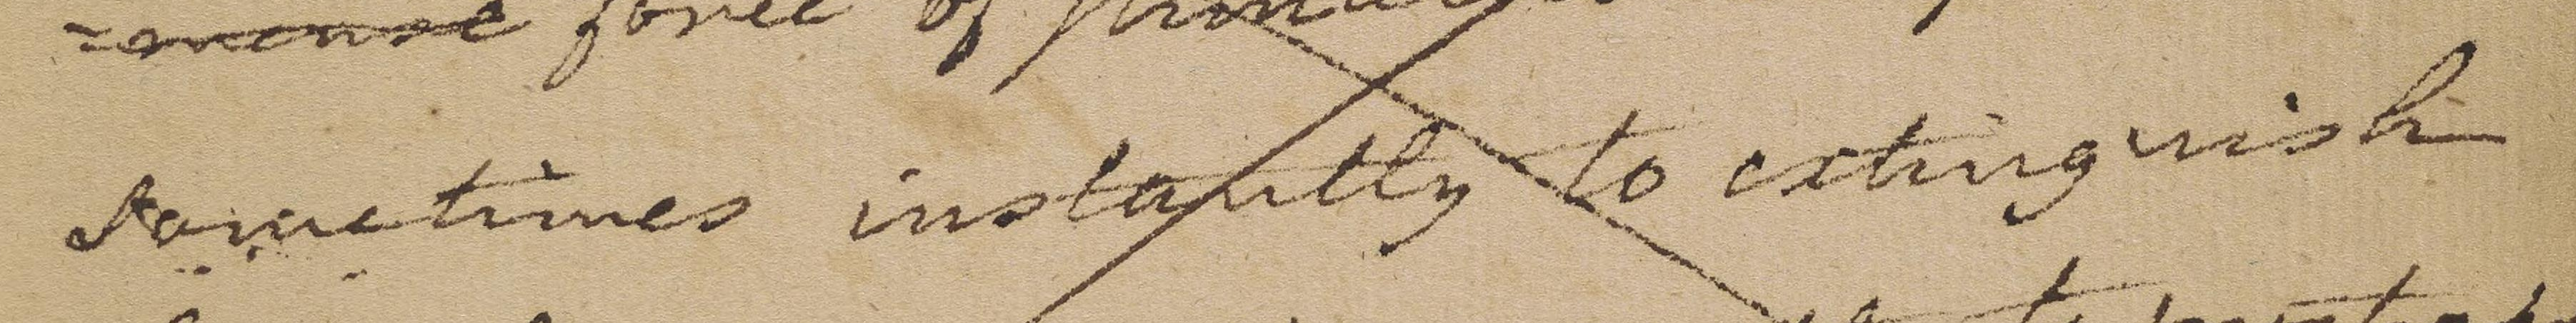sometimes instantly to extinguish
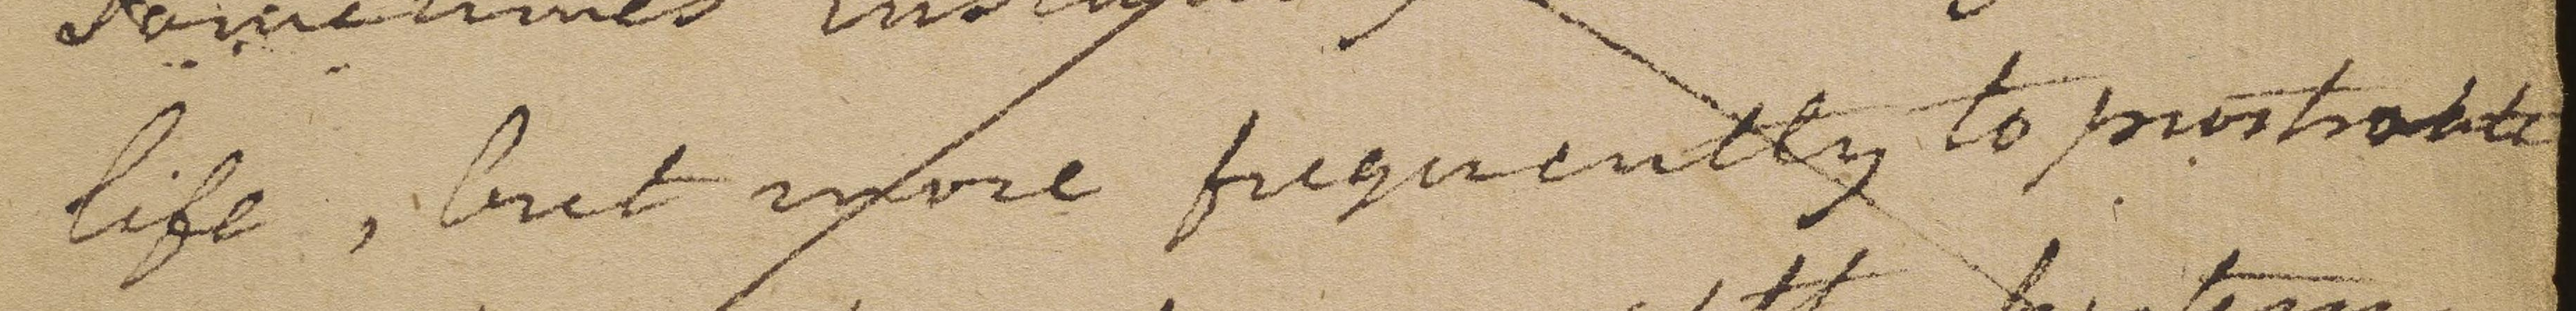life, but more frequently to prostrate
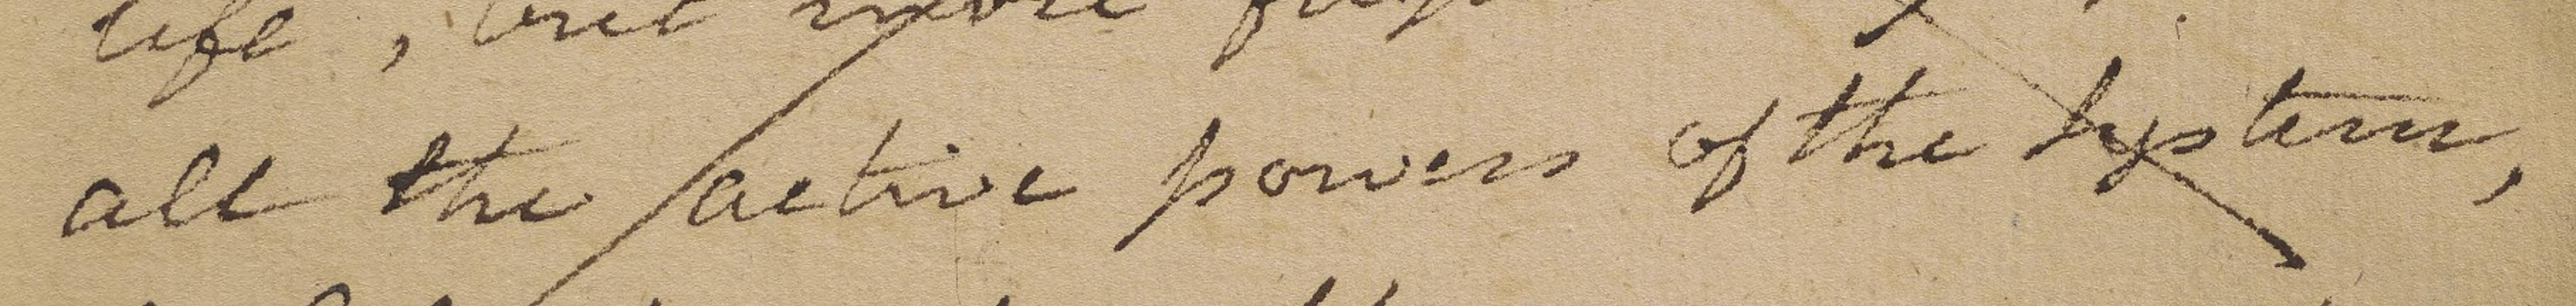all the active powers of the system,
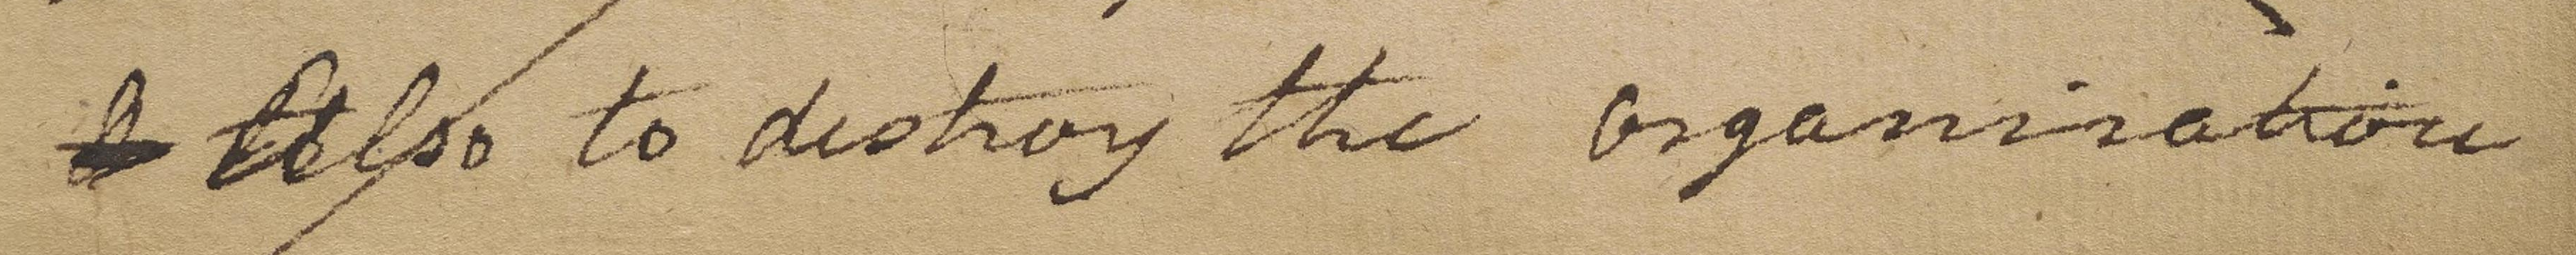[&] Also to destroy the organisation
